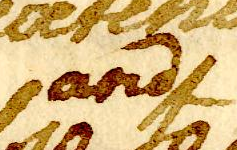and
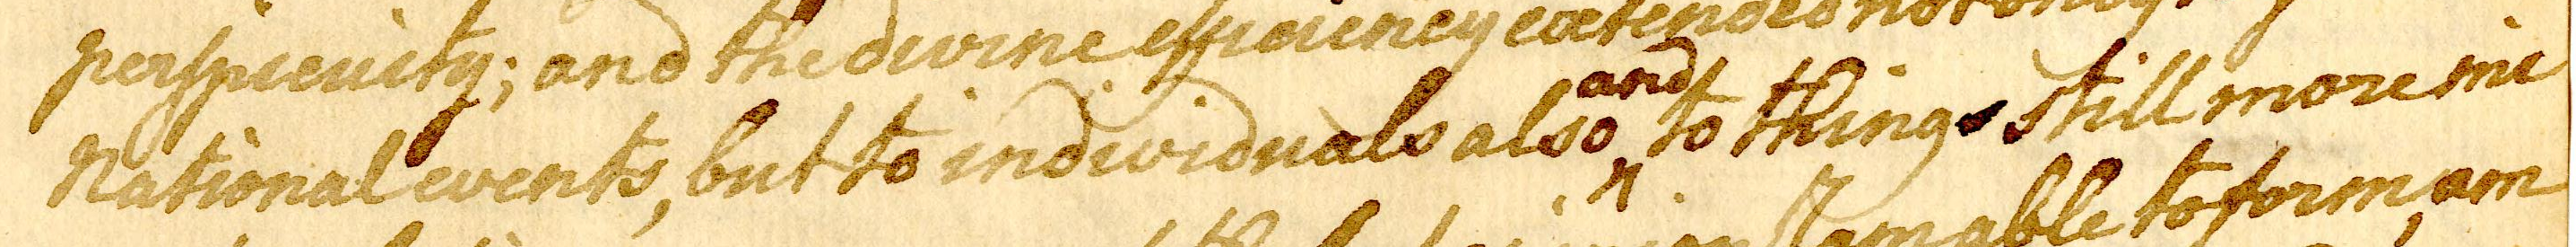National events, but to individuals also ^ to things still more mi
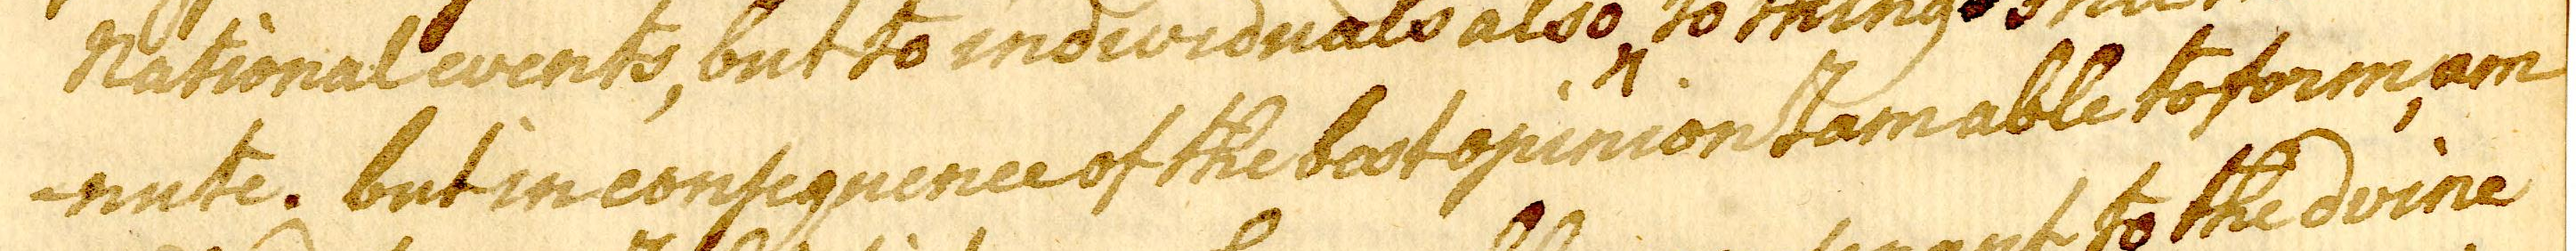-nute. but in consequence of the best opinion I am able to form, am
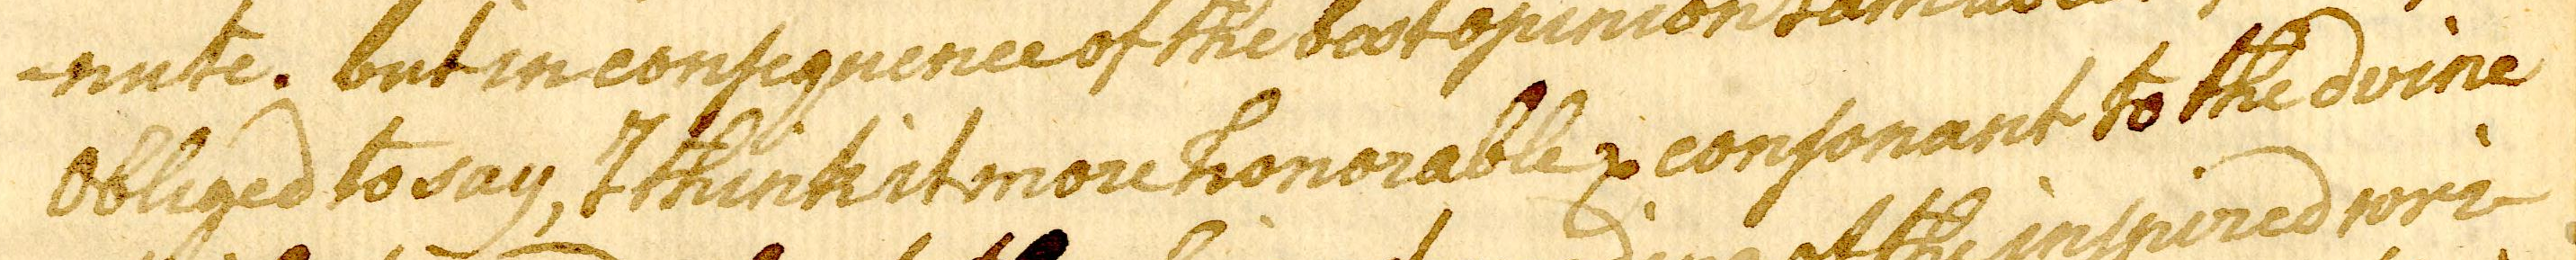Obliged to say, I think it more honorable & consonant to the divine
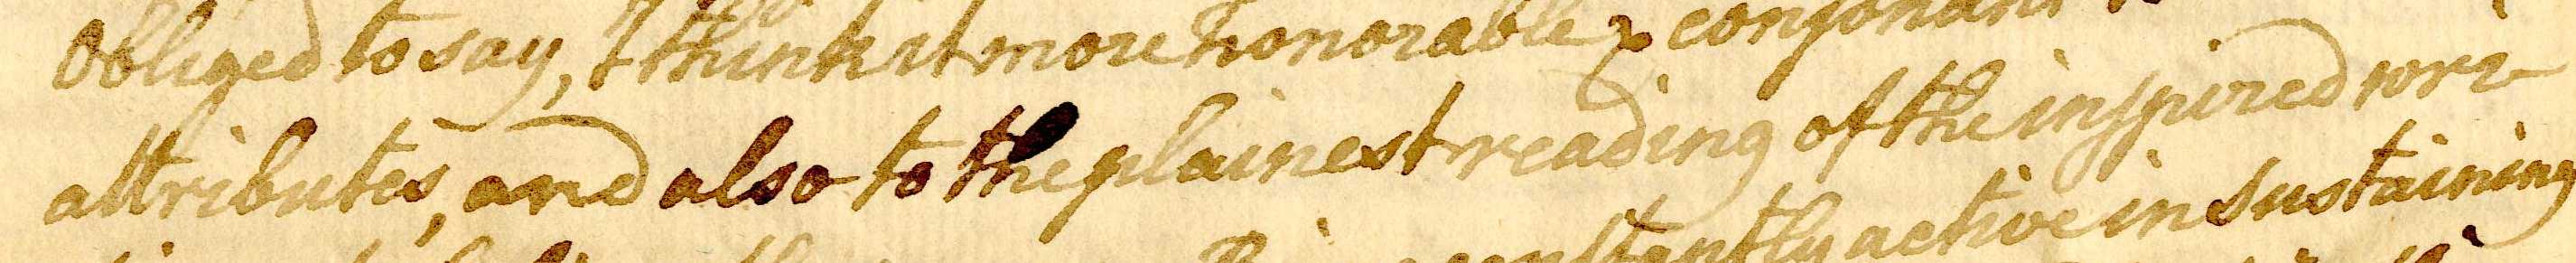attributes, and also to the plainest reading of the inspired wri-
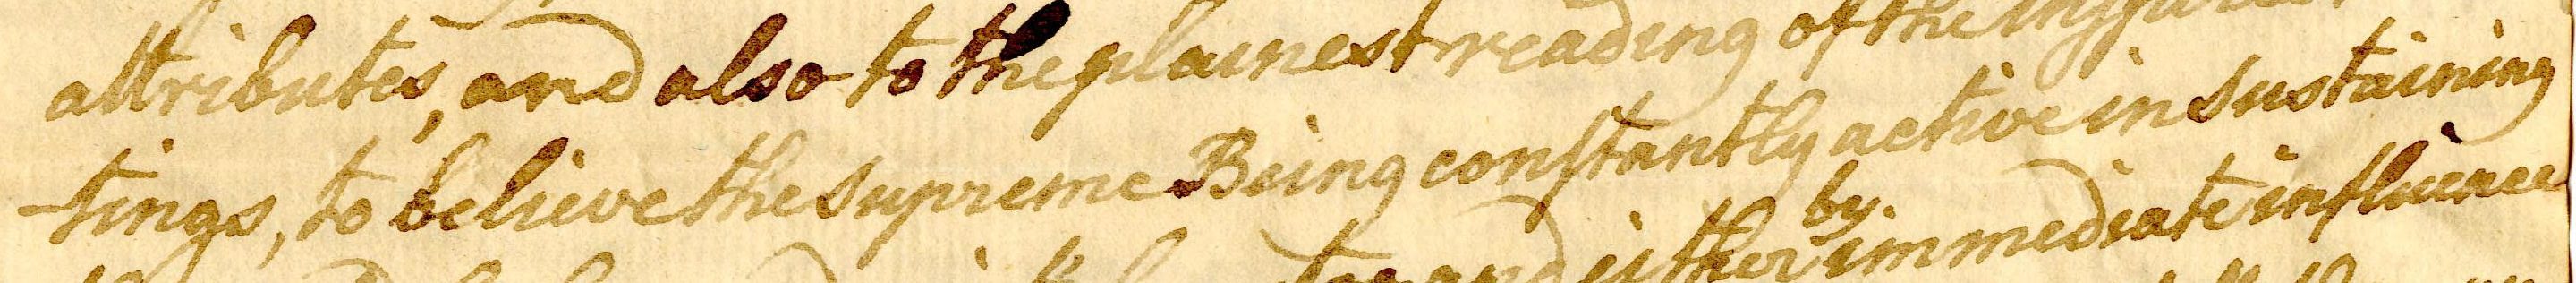-tings, to believe the Supreme Being constantly active in sustaining
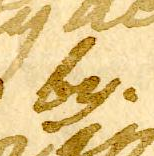by
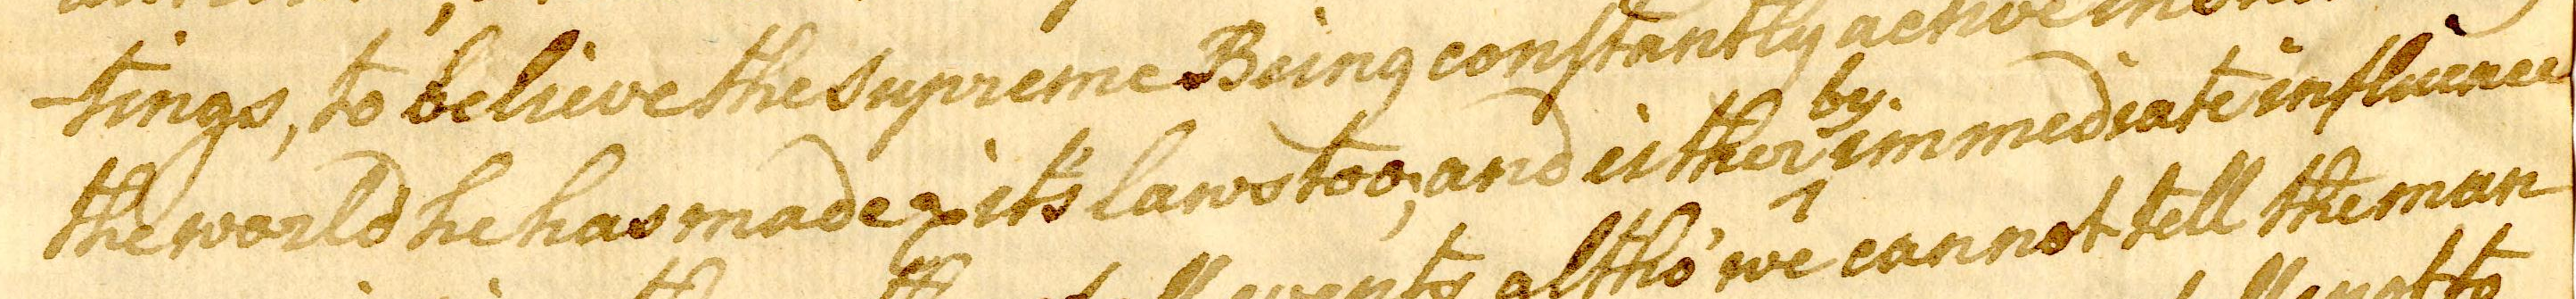the world he has made & it's laws too, and either ^ immediate influence
